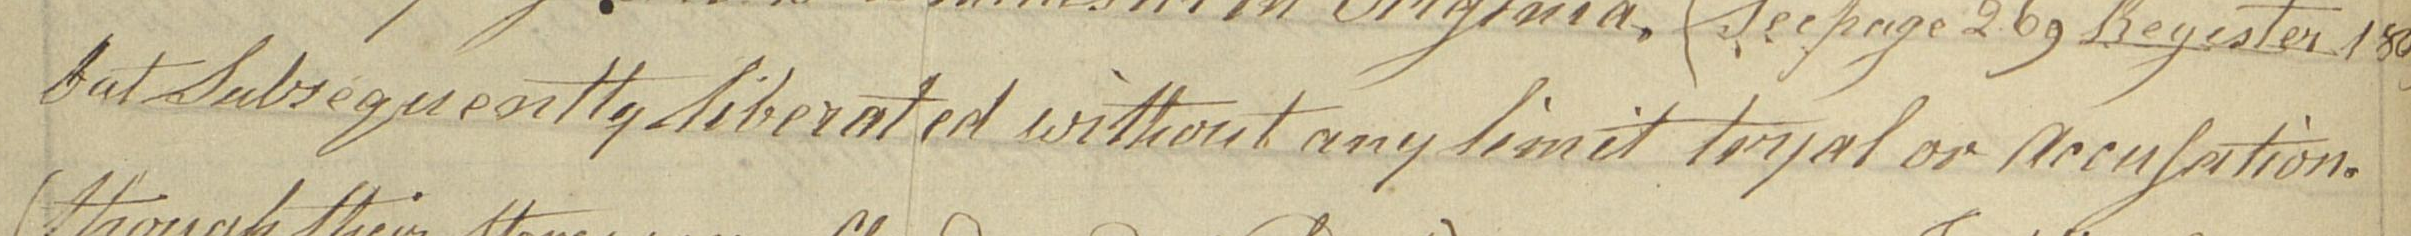but Subsequently liberated without any limit loyal or accusation.
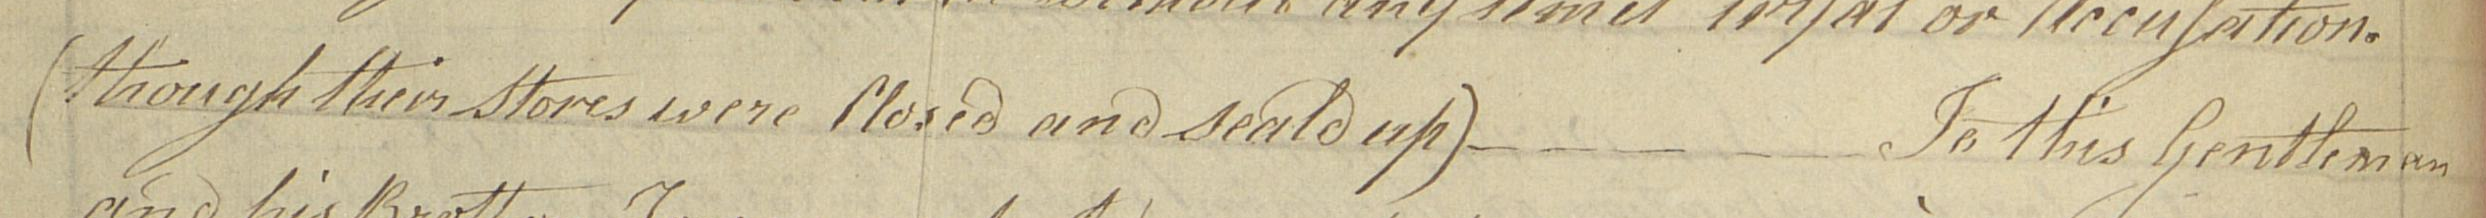(though their Stores were Closed and seald up) To this Gentleman
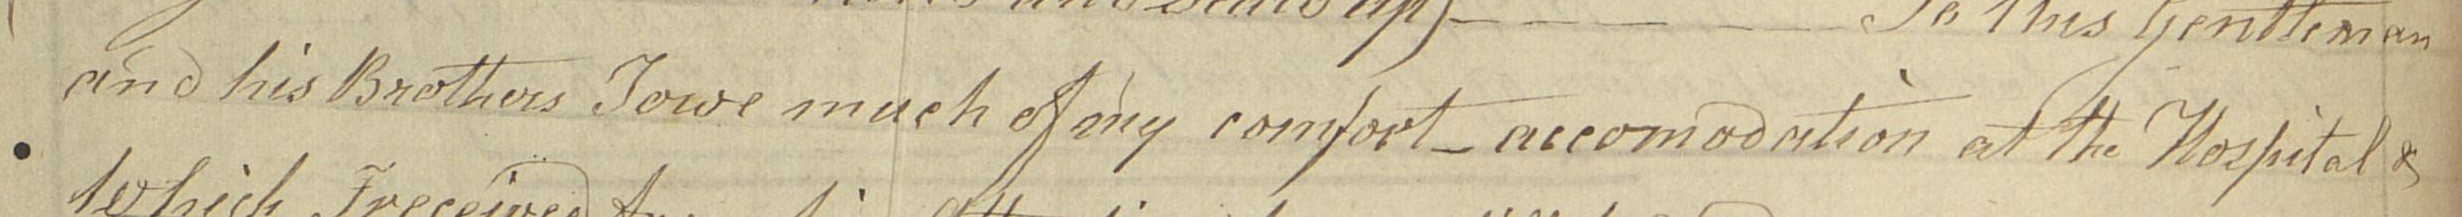and his Brothers Towe much of my comfort, accomodation at the Hospital &
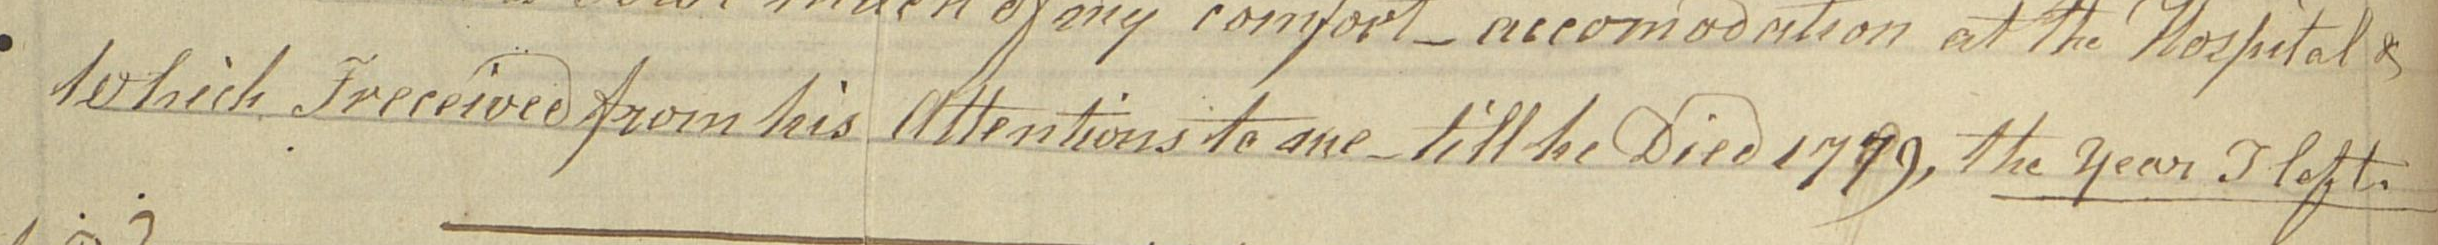which I received from his Attentions to me till be Died 1779, the year I left.
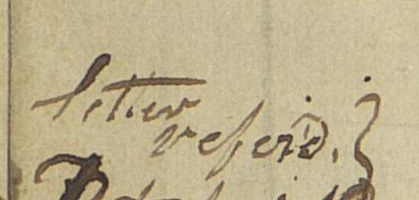letter refer'd
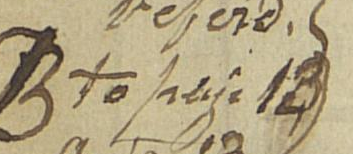B to page 13
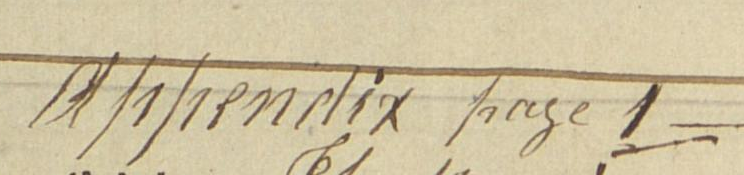Appendix page 1
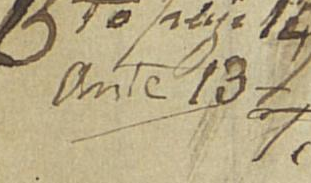Ante 13
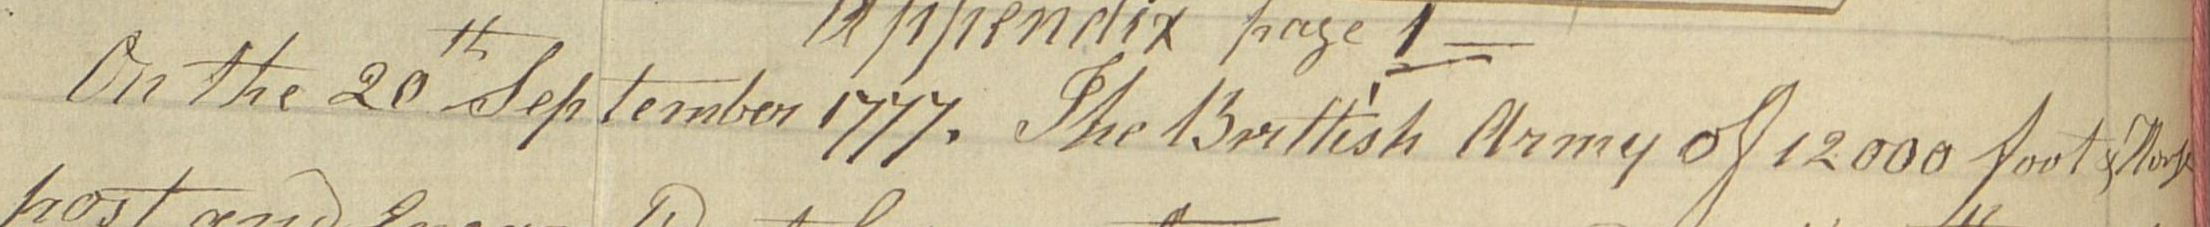On the 20^th September 1777, The Brittish Army of 12000 foot & horse
